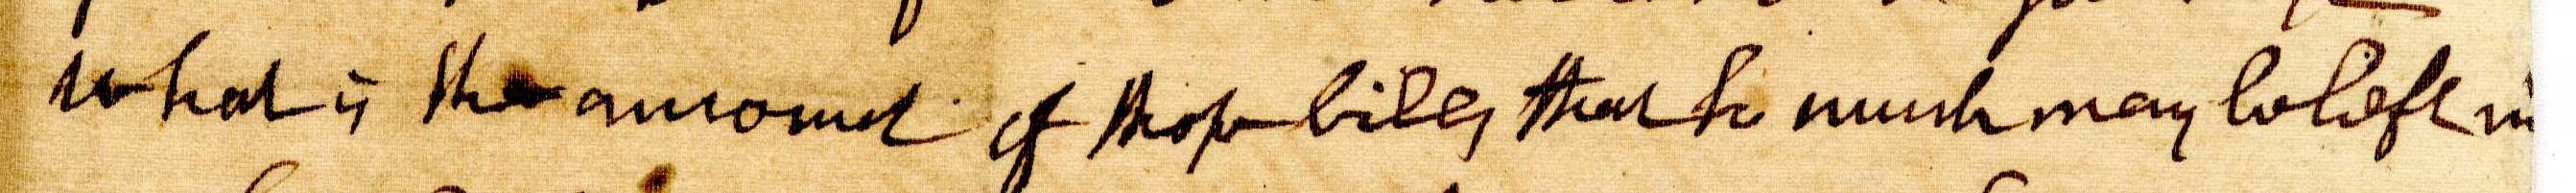What is the amount of those bills than h much may be left in
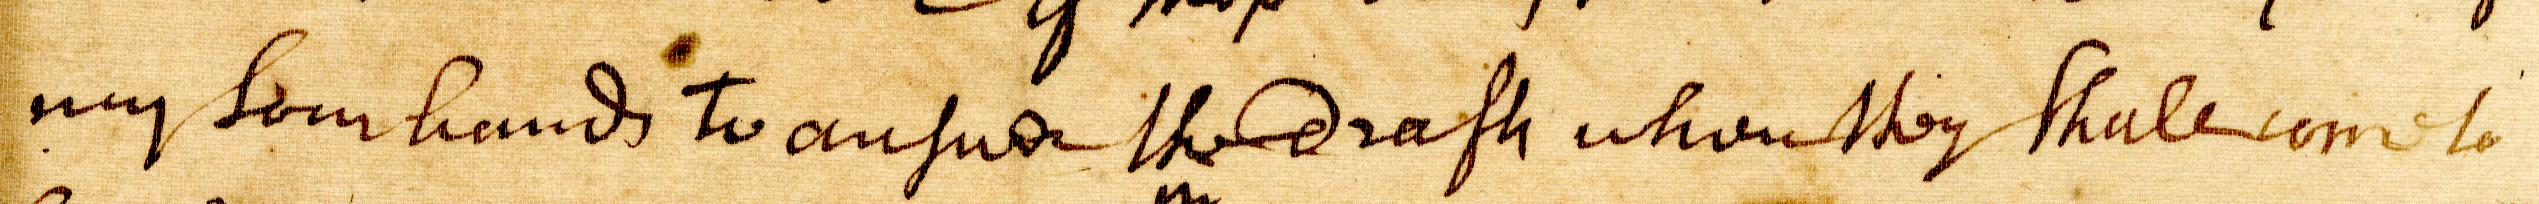my sum hands to answer the draft when they shall com^e to
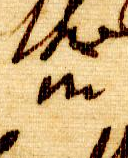in
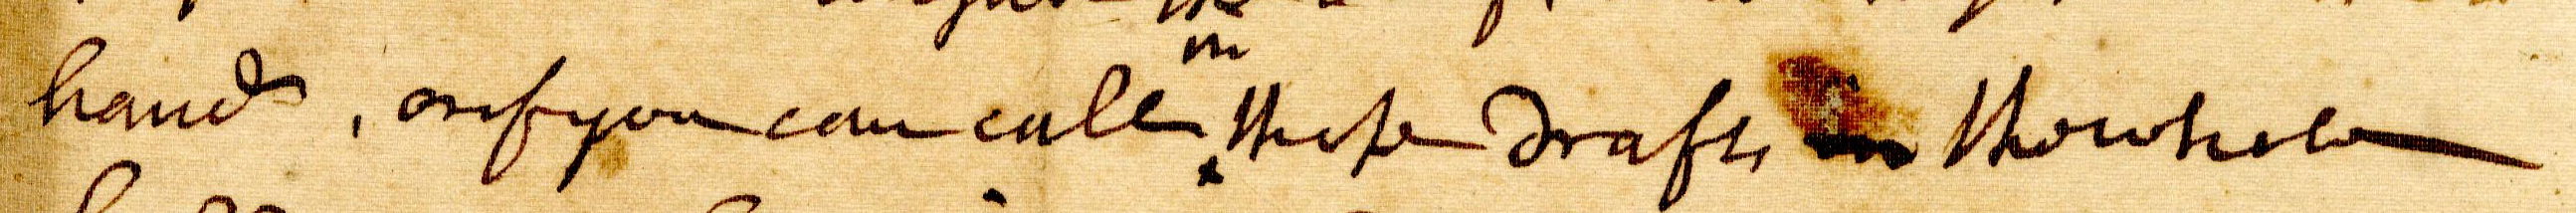hand, and you can call ^ these drafts [in] the whole
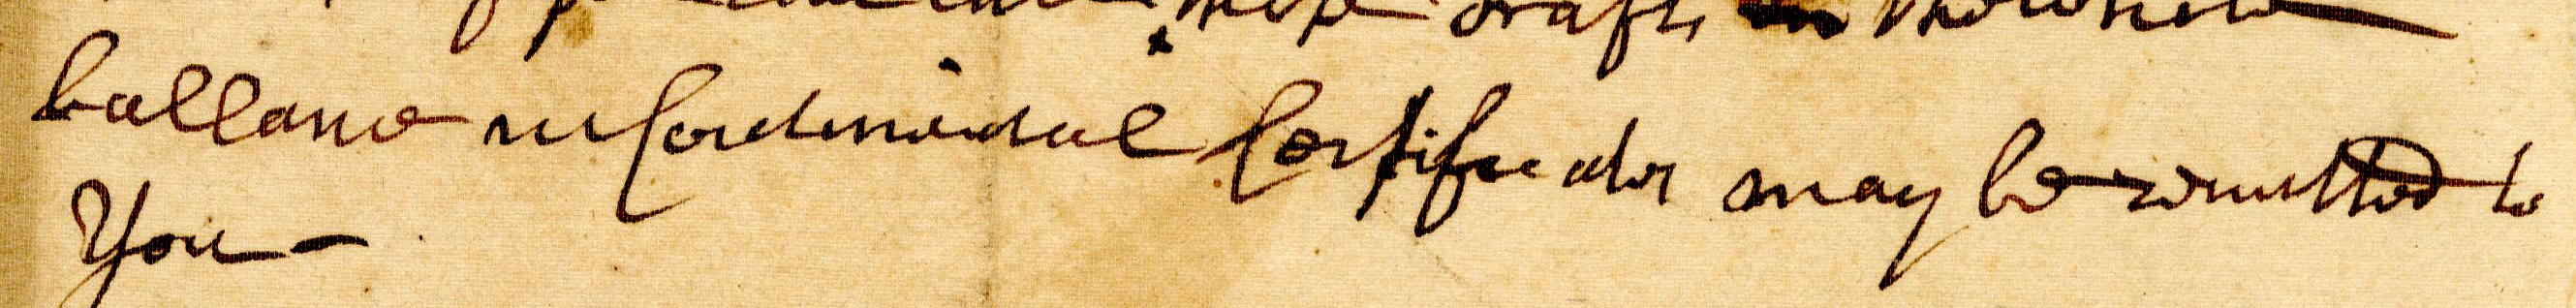ballance in Continental Certificates may be writted to
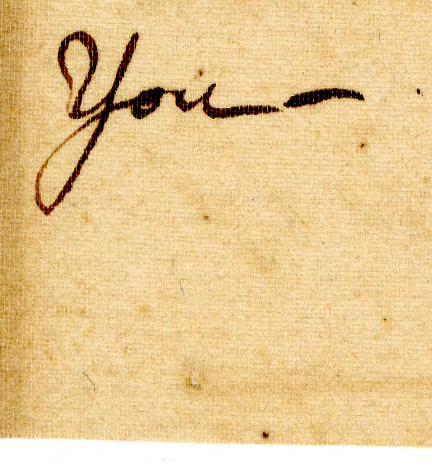You-
